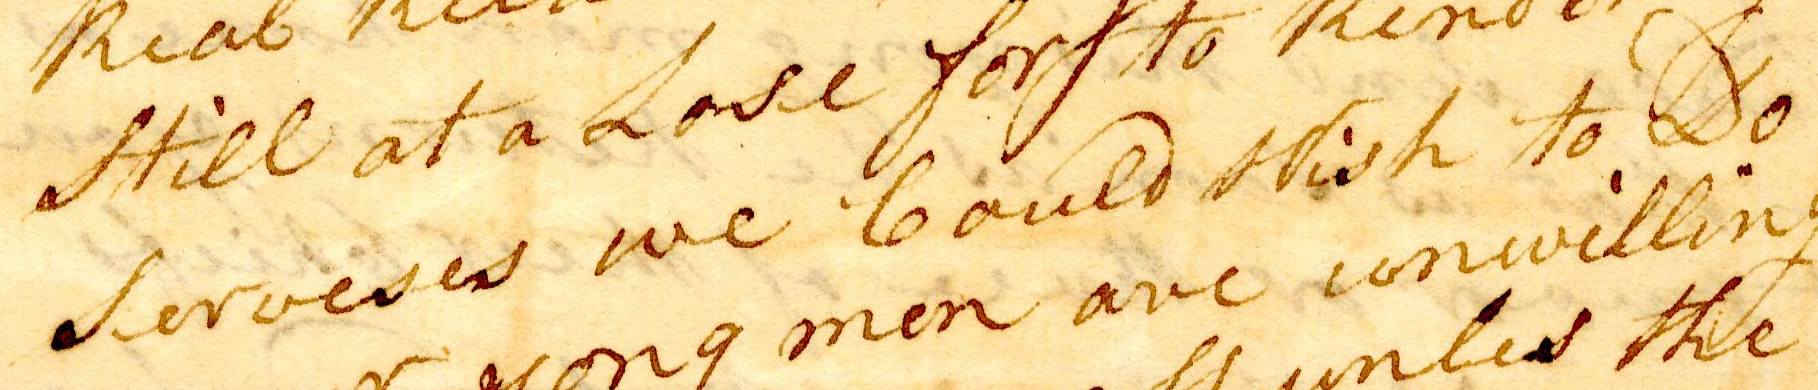Serveses we Could Wish to Do-
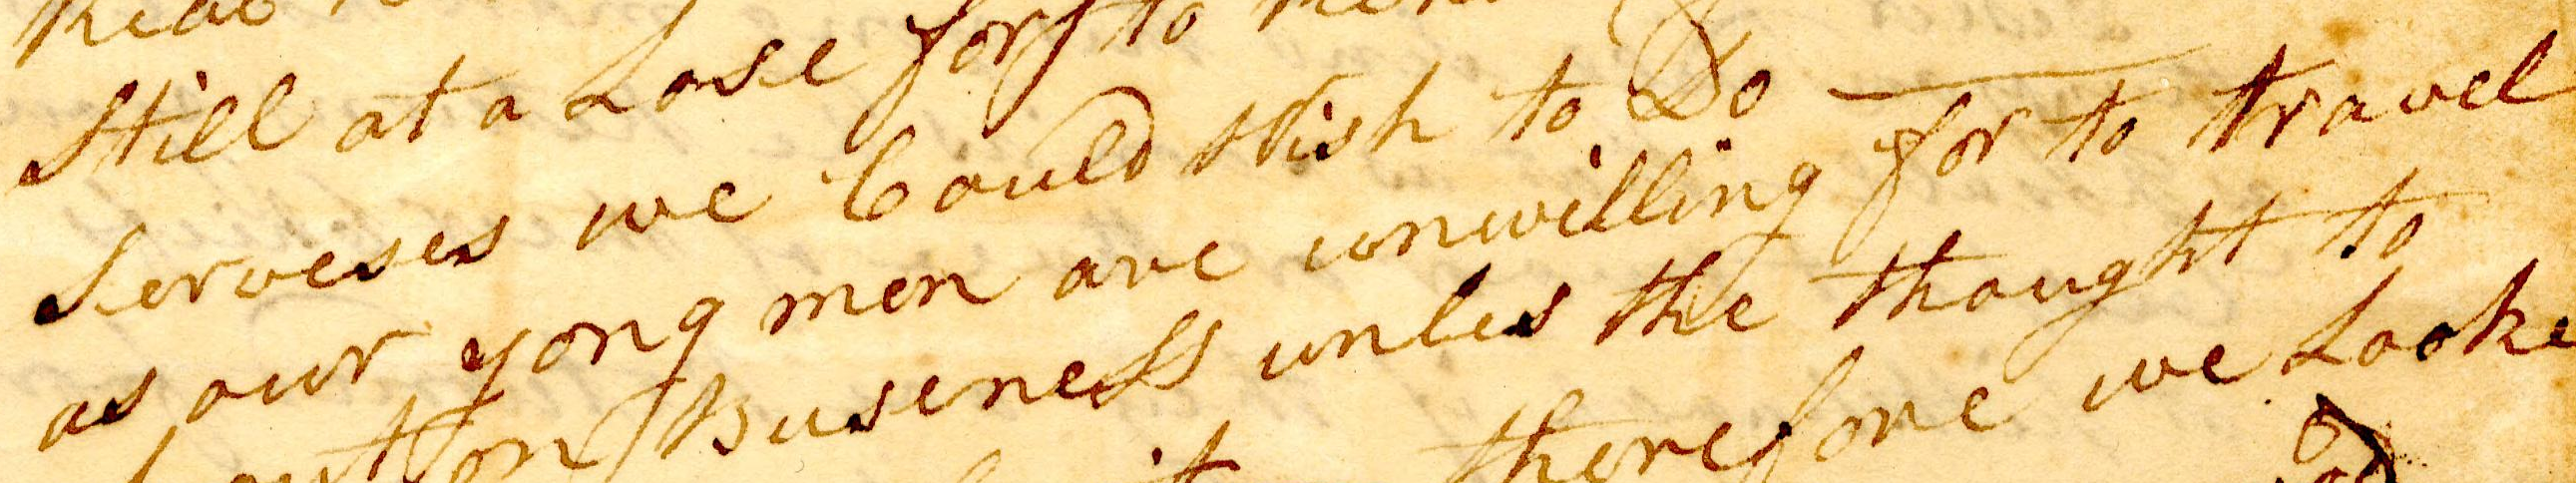as our yong men are unwilling for to travel
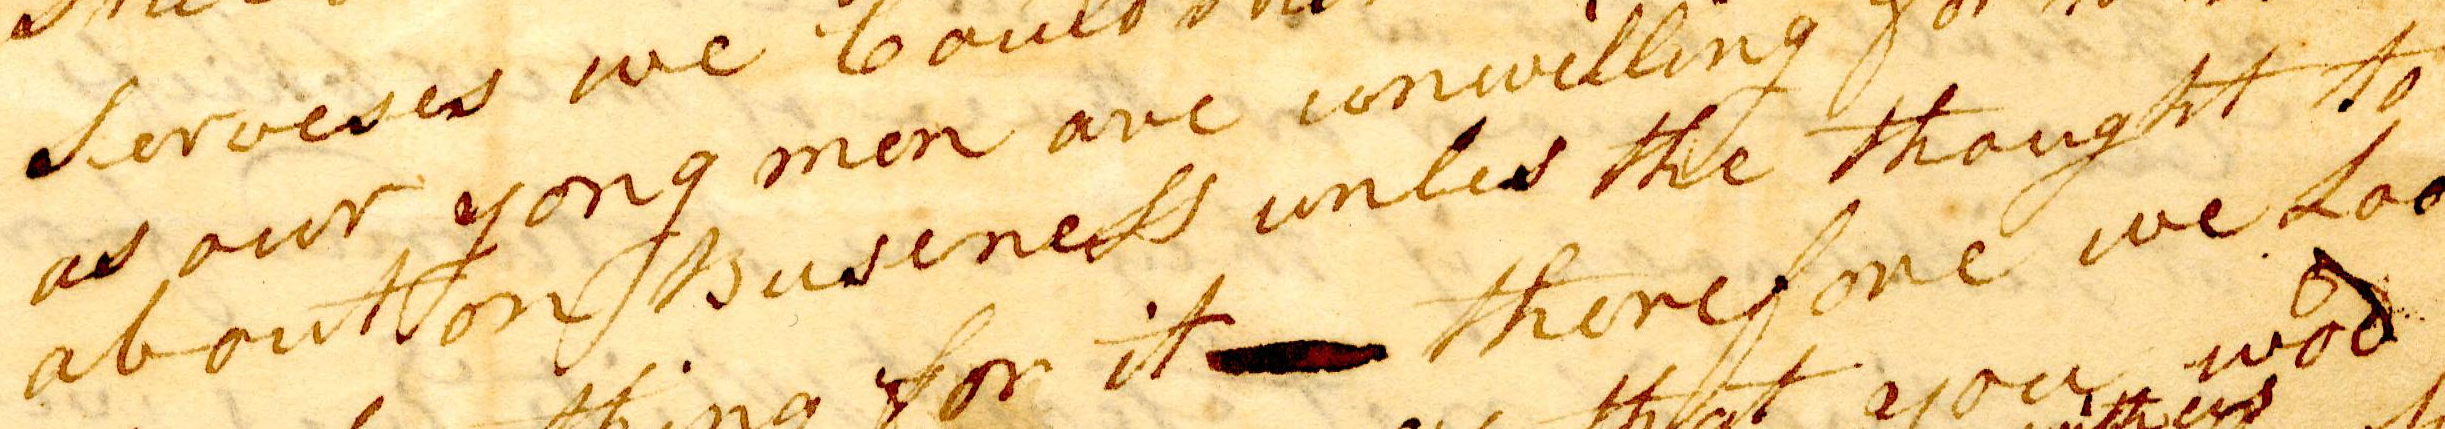about on Buseness unless the thought to
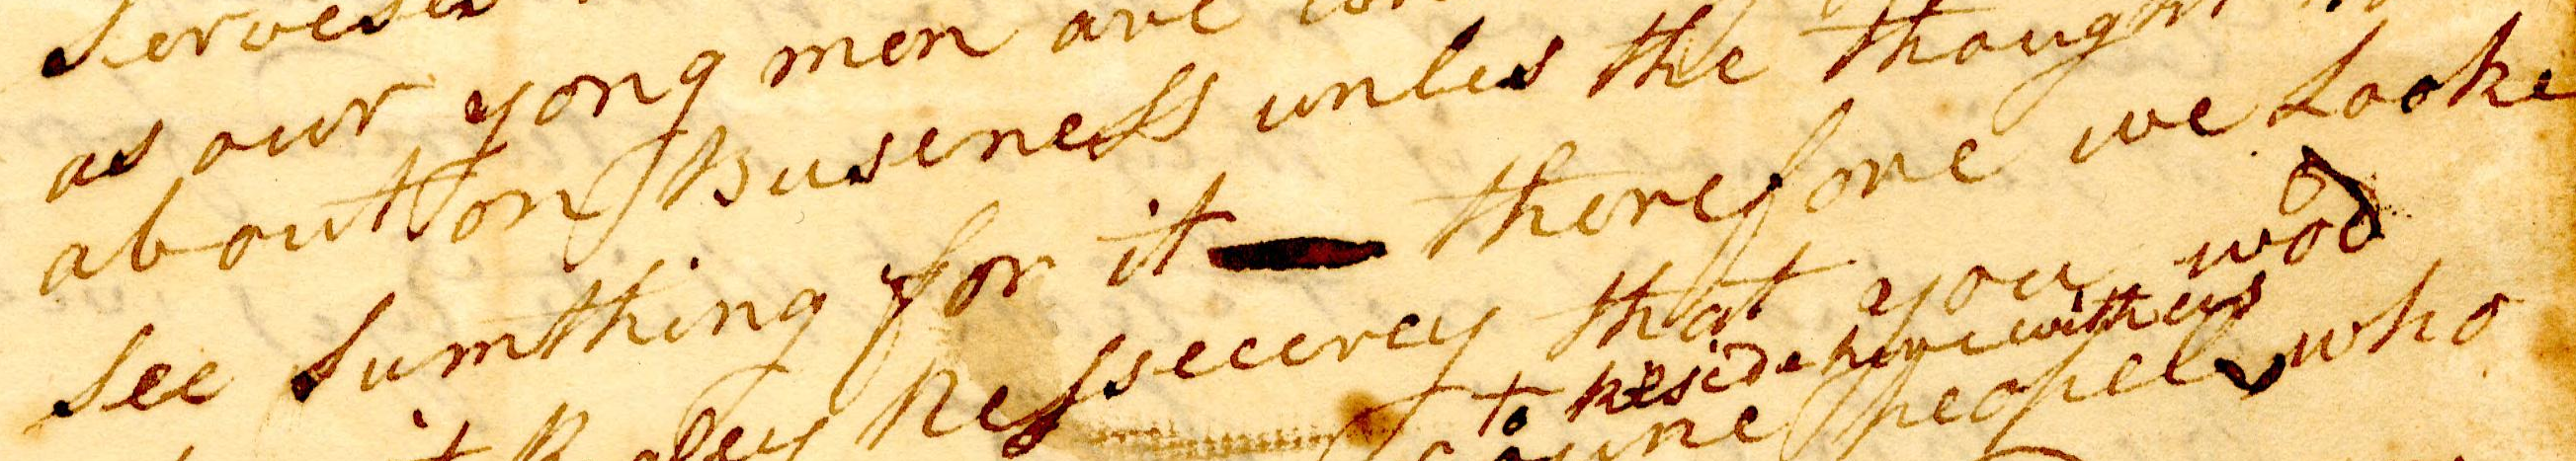see Sumthing for it- therefore we Looke
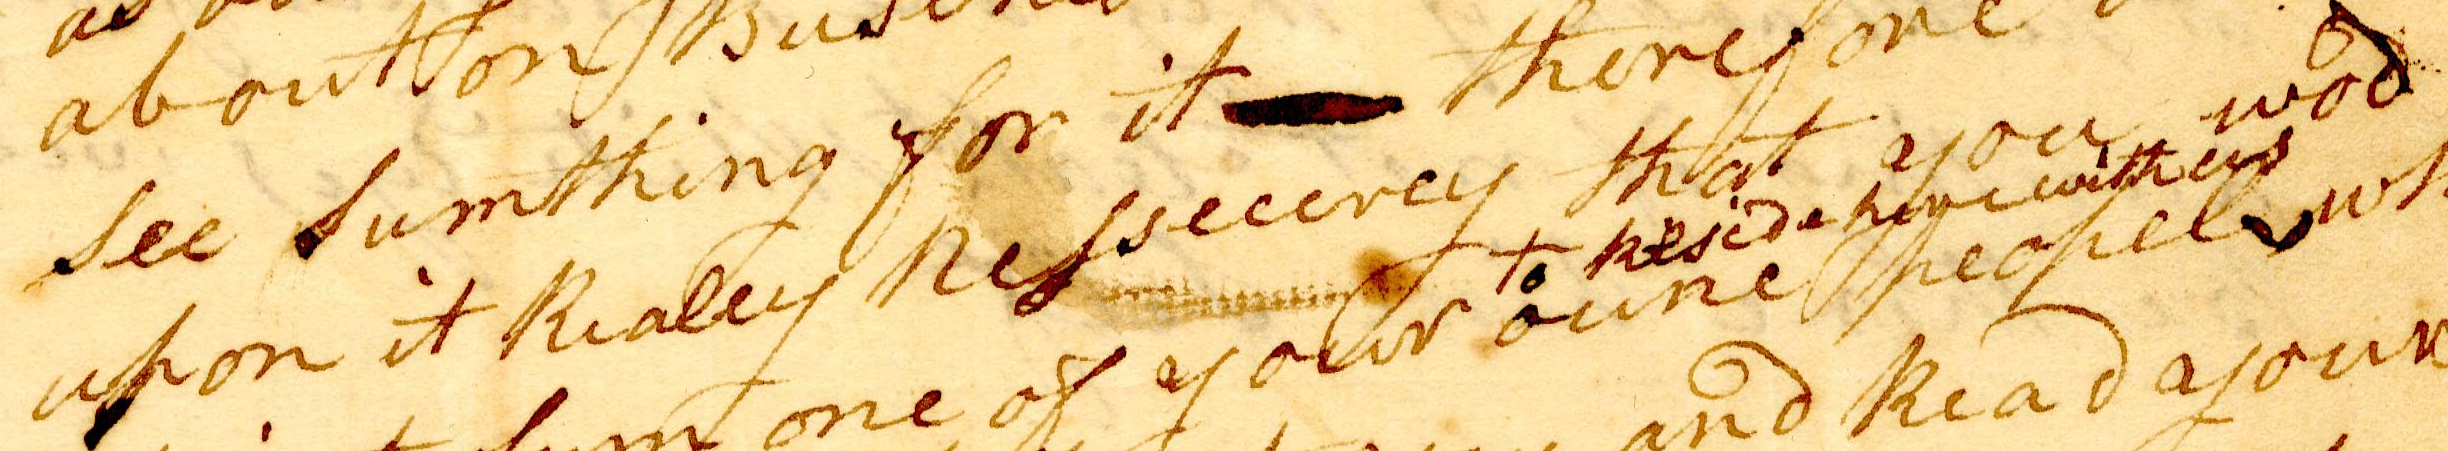upon it Really Nessecerey that you wod
